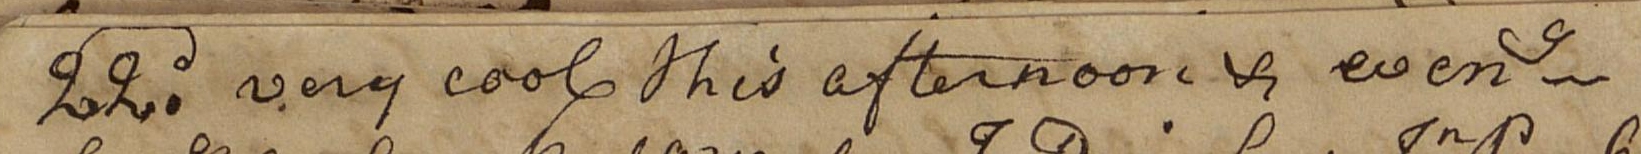22.^d very cool this afternoon & even^g-
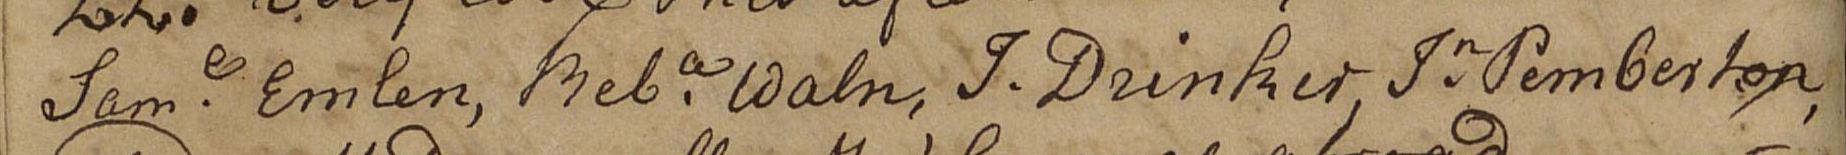Sam^l. Emlen, Reb^a. Waln, J. Drinker, J^n. Pemberton,
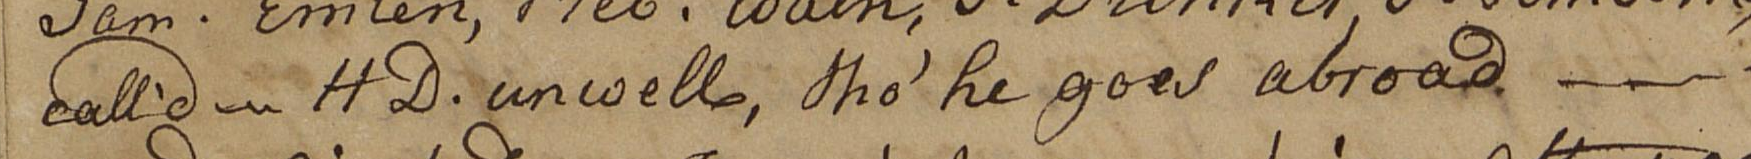call'd- HD. unwell, tho' he goes abroad-
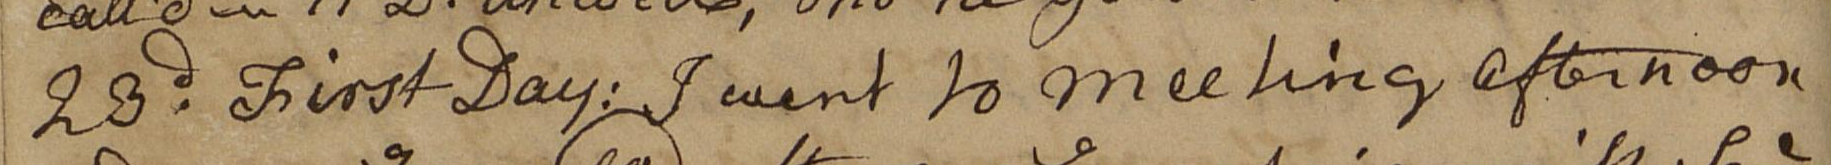23^d. First Day: I went to meeting afternoon
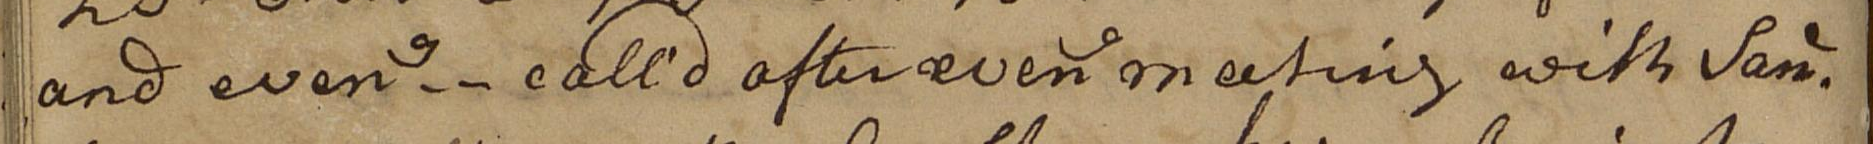and even^g-- call'd after even^g meeting with Sam.^l
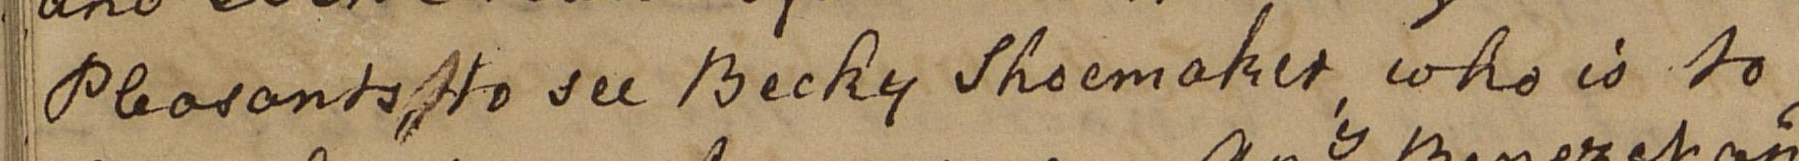Pleasants to see Becky Shoemaker, who is to
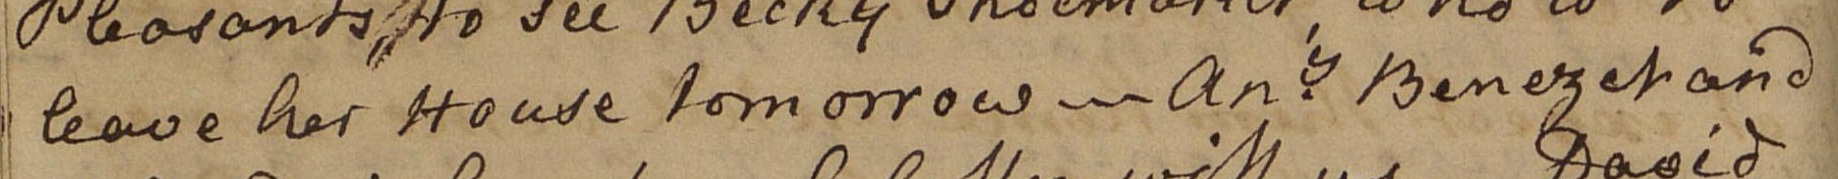leave her House tomorrow- An^y Benezet and
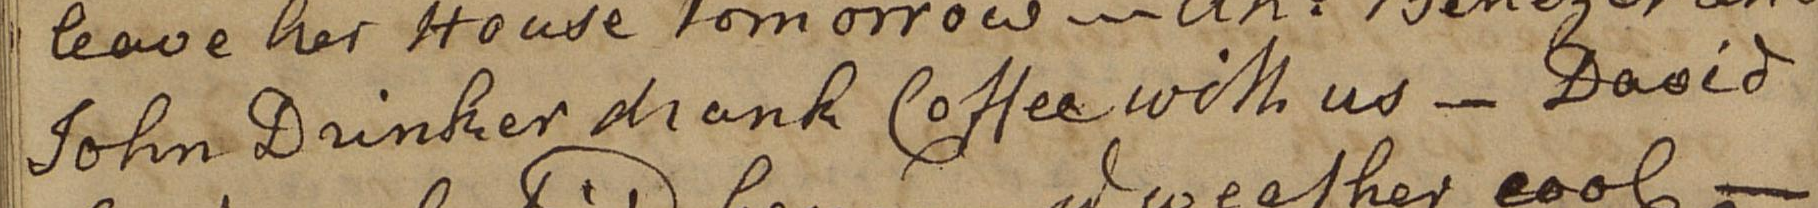John Drinker drank Coffee with us- David
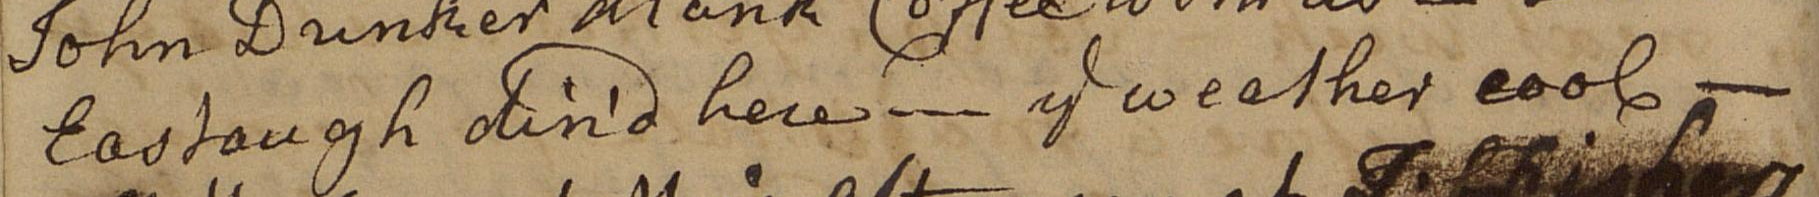Eastaugh din'd here- y^e weather cool-
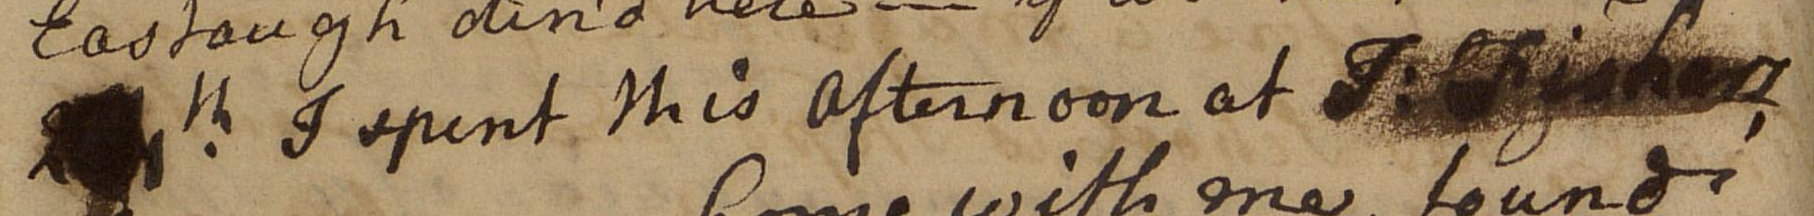24^th I spent this afternoon at J: Fishers,
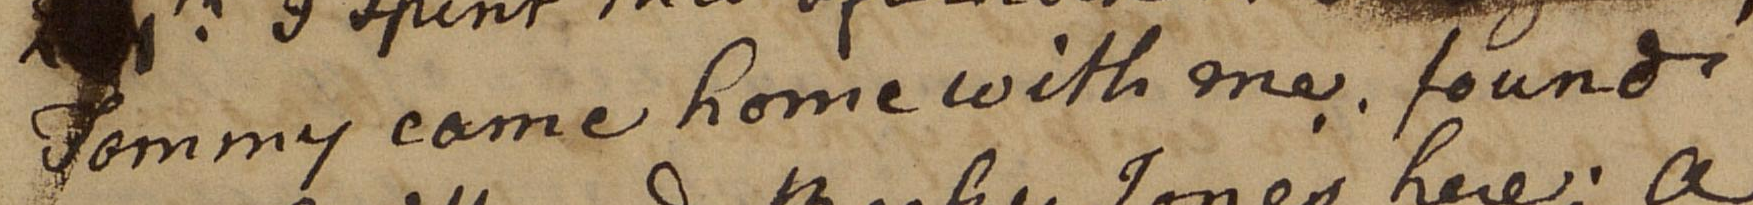Tommy came home with me, found
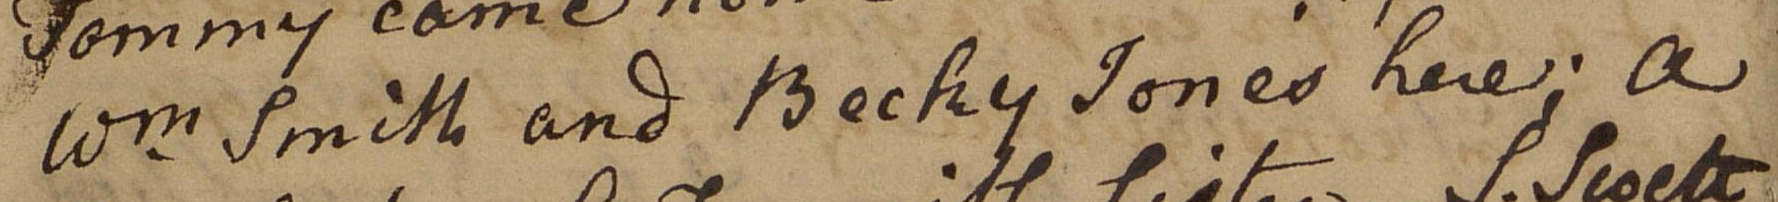W^m. Smith and Becky Jones here; a
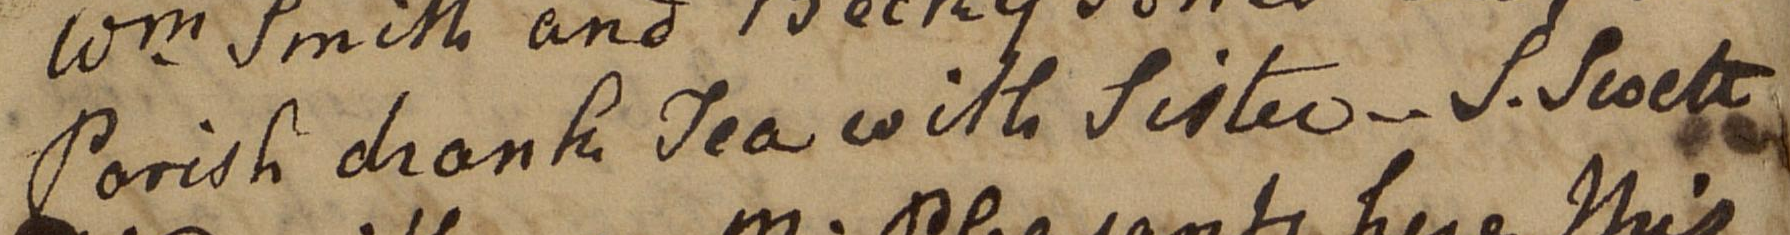Parish drank Tea with Sister- S. Swett
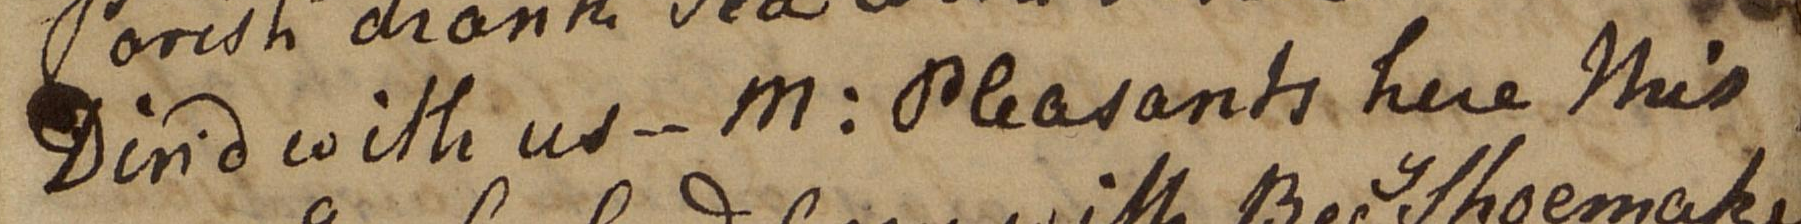Din'd with us- M: Pleasants here this
